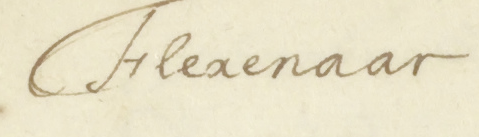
Flexenaar
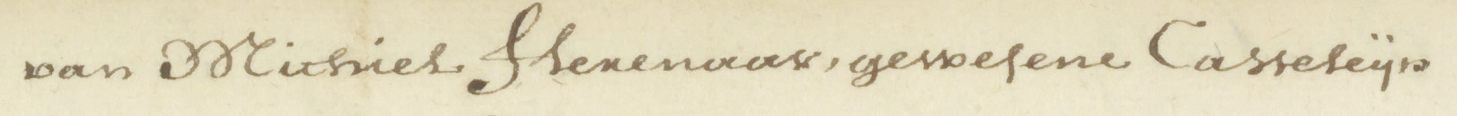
van Michiel Flexenaar, gewesene Casseleijn
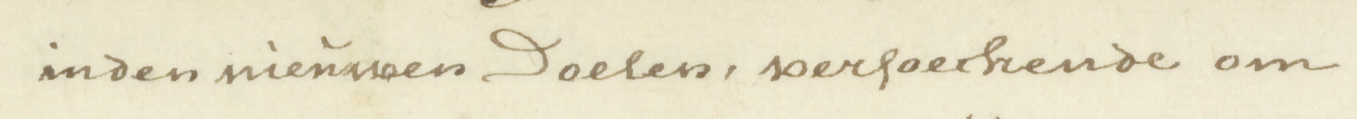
inden nieuwen Doelen, versoeckende om
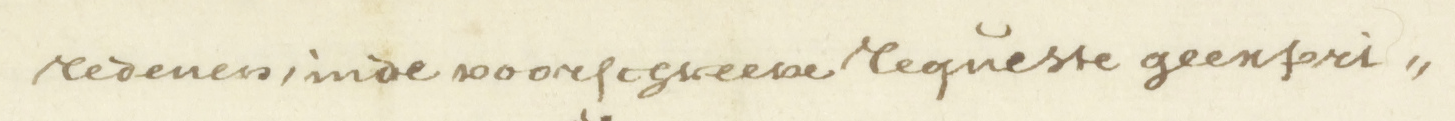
redenen, inde voorschreeve requeste geexpri„
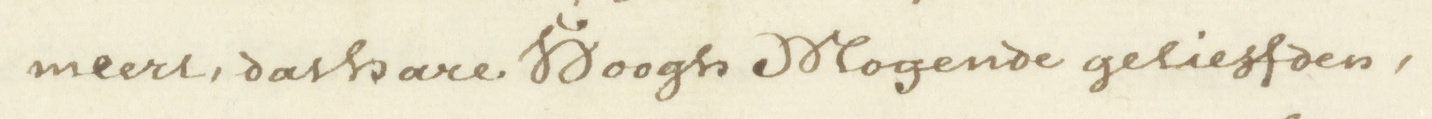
meert, dat haere Hoogh Mogende gelieffden,
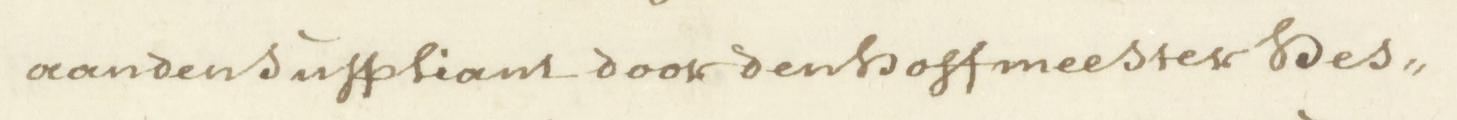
aan den suppliant door den hoffmeester Hes„
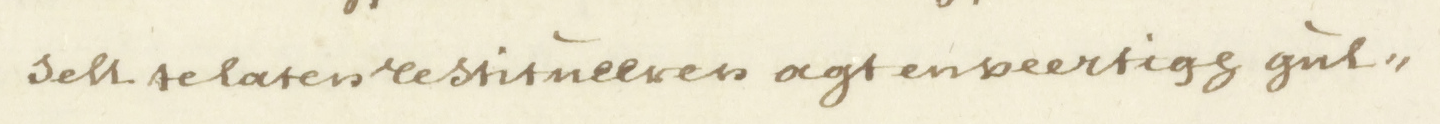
selt te laten restitueeren agt en veertigh gul„
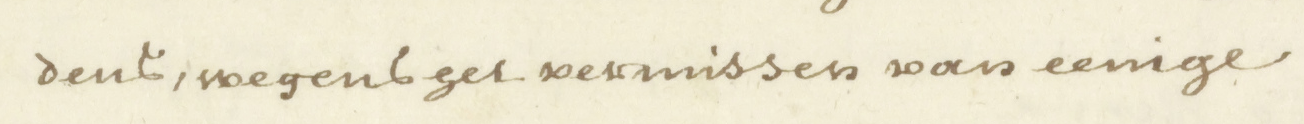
dens, wegens het vermissen van eenige
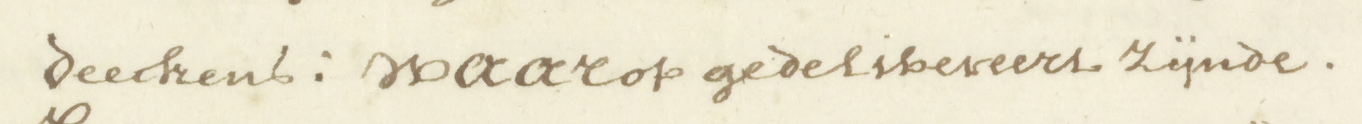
deeckens: Waarop gedelibereert zijnde,
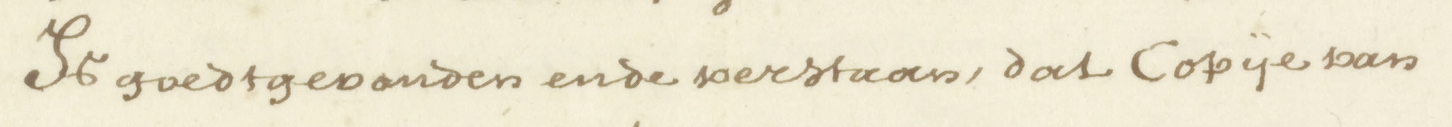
Is goedtgevonden ende verstaan, dat Copije van
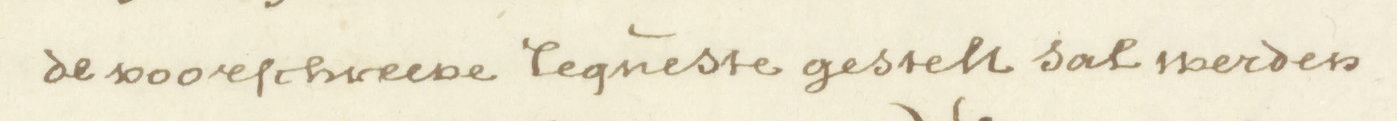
de voorschreeve Requeste gestelt sal werden
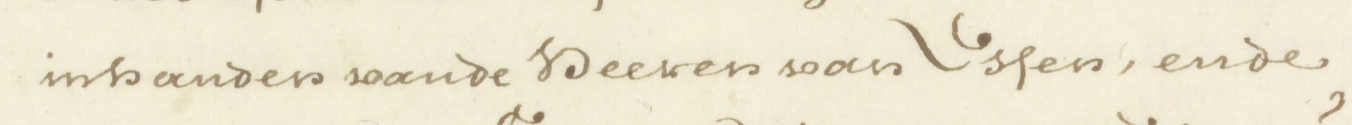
in handen vande Heeren van Essen, ende
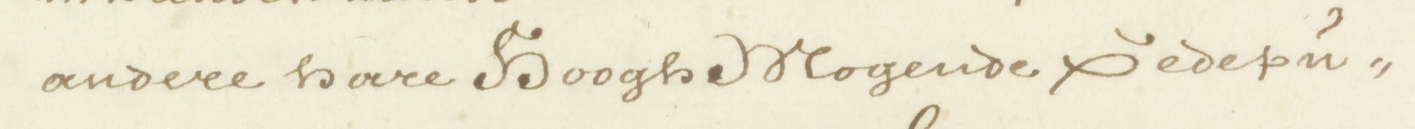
andere haere Hooghe Mogende Gedepu„
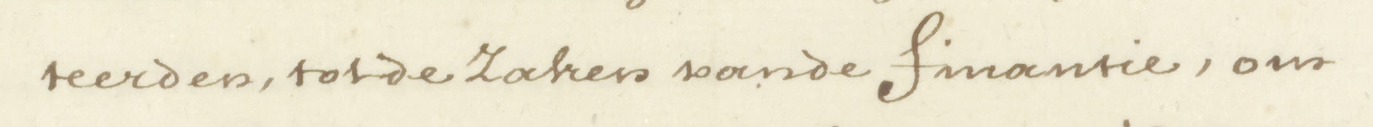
teerden tot de zaken vande Finantie, om
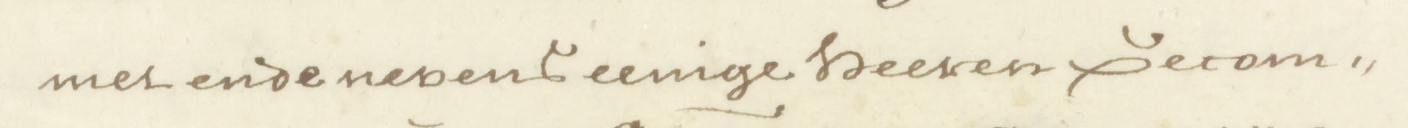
met ende nevens eenige heeren Gecom„
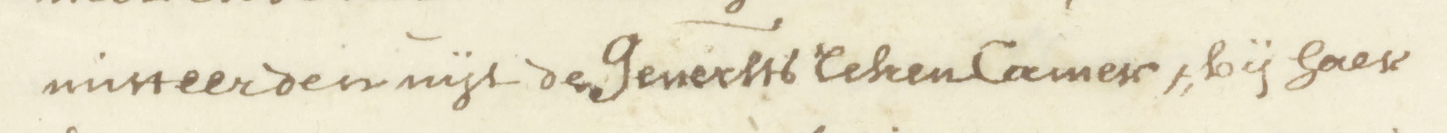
mitteerden uijt de Generlts. Rekencamer, bij haer
